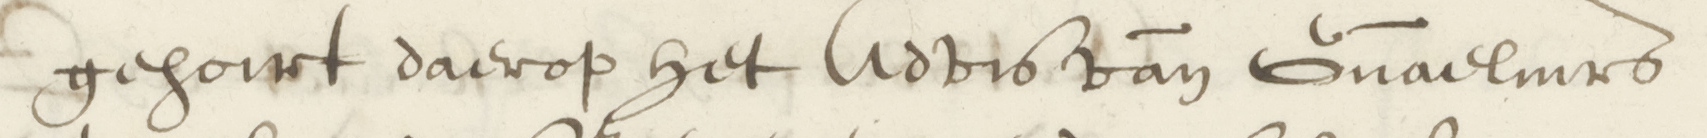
gehoirt daerop het advis van Gnaelmrs
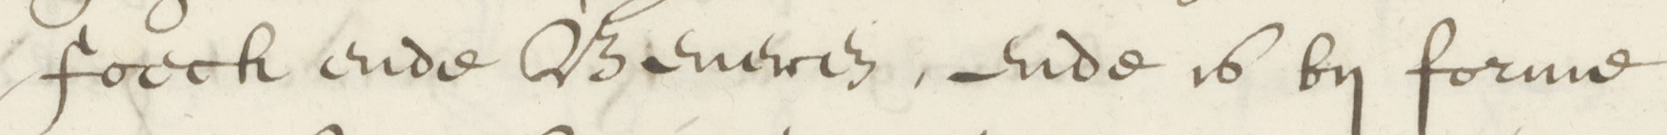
Foeck ende Beueren, ende is bij forme
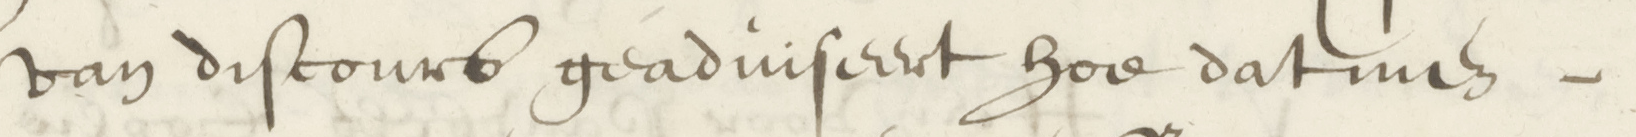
van discours geaduiseert hoe dat men -
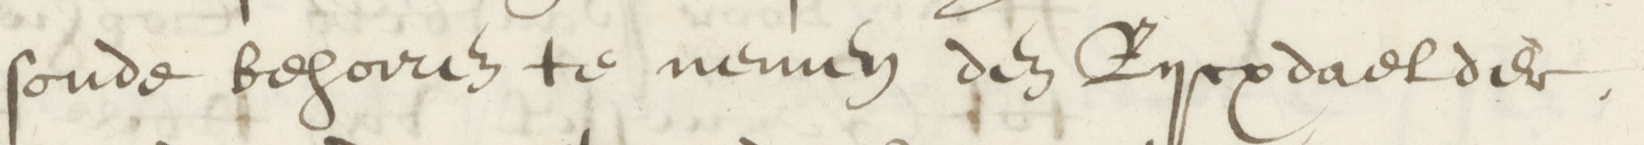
soude behoiren te nemen den Rycxdaelder,
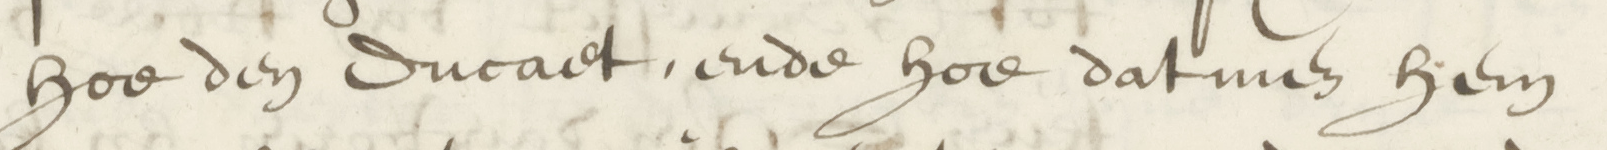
hoe den Ducaet, ende hoe dat men hem
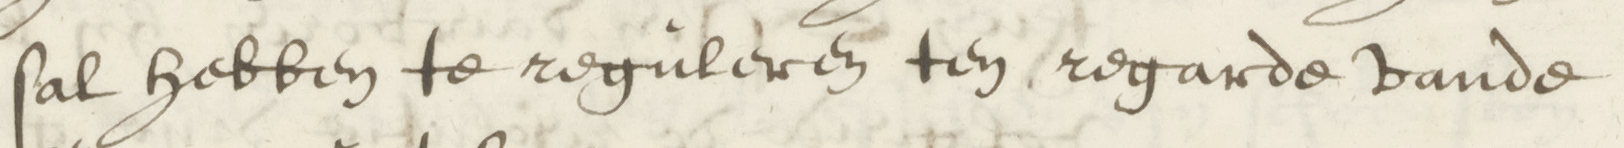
sal hebben te reguleren ten regarde vande
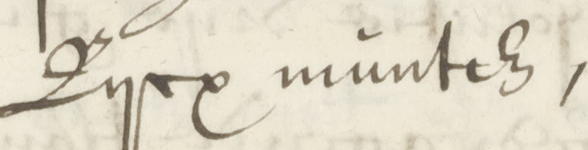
Rycxmunten.
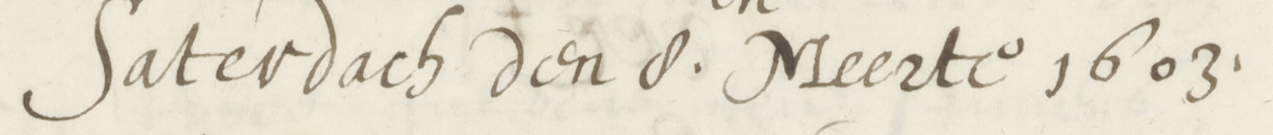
Saterdach den 8en. Meerte 1603.
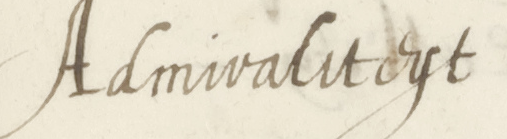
Admiraliteyt
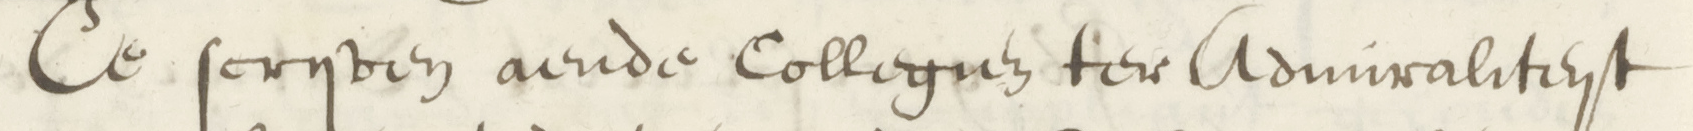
Te scryven aende Collegien ter Admiraliteyt
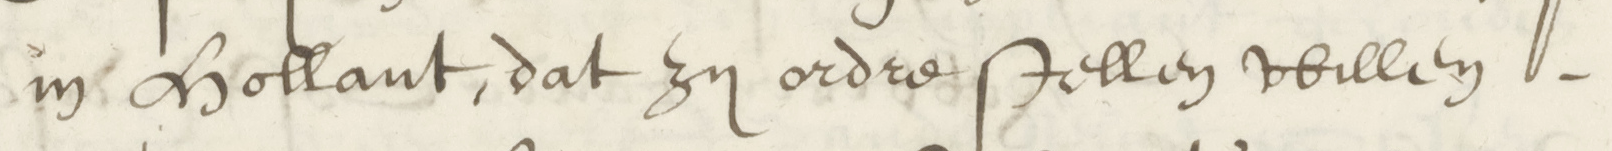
in Hollant, dat zy ordre stellen willen -
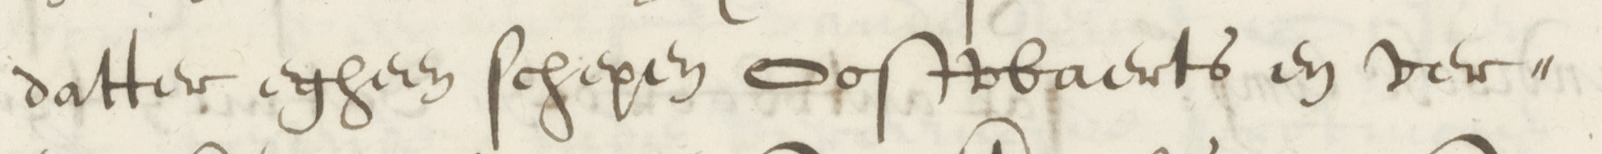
datter egheen schepen Oostwaerts en ver„
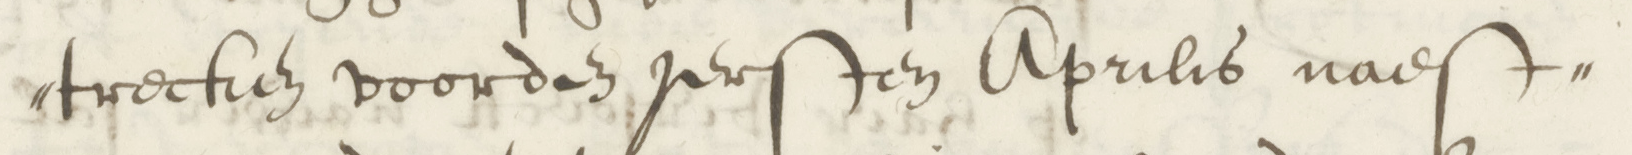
„trecken voorden Iersten Aprilis naest„
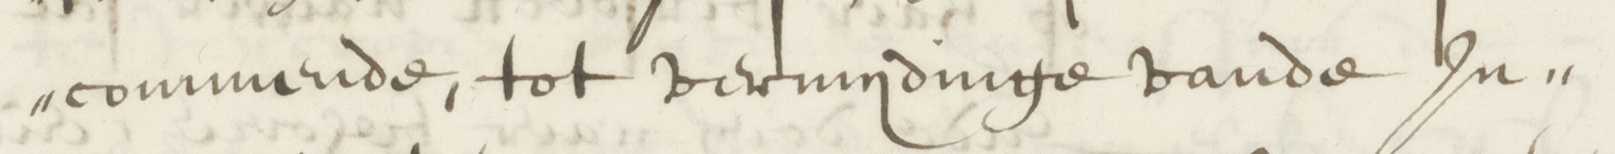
„commende, tot vermydinge vande In„
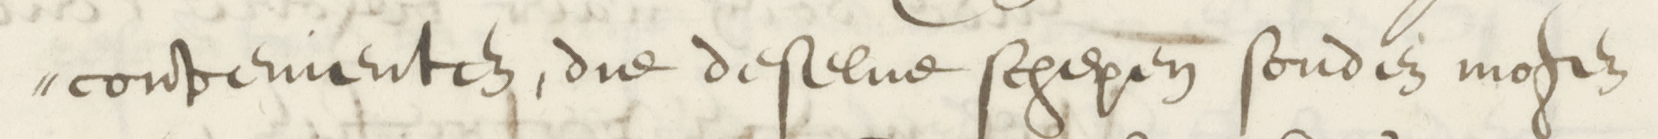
,convenienten, die deselue schepen souden mogen
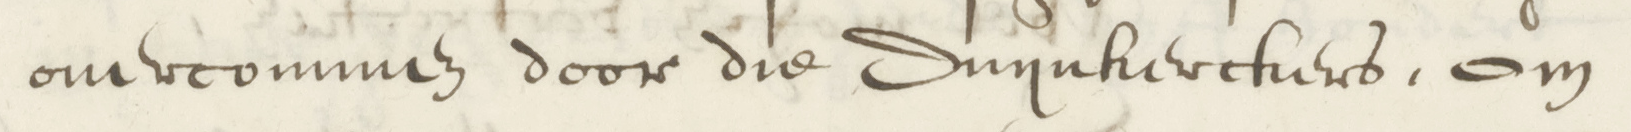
ouercommen door die Duynkerckers, om
